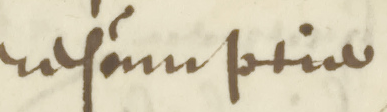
resumptie.
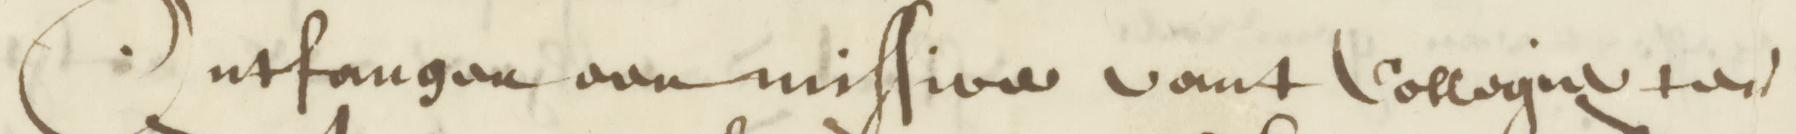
Ontfangen een missive vant Collegie ter
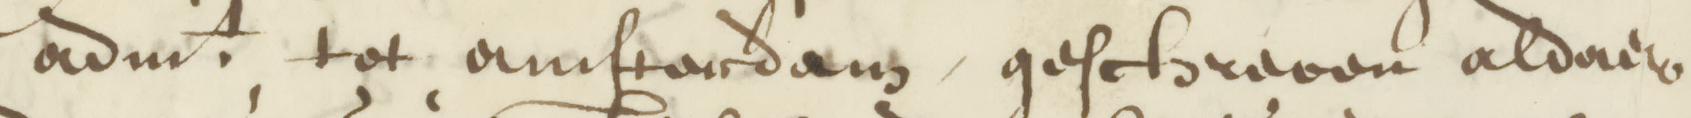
admt. tot Amsterdam, geschreven aldaer
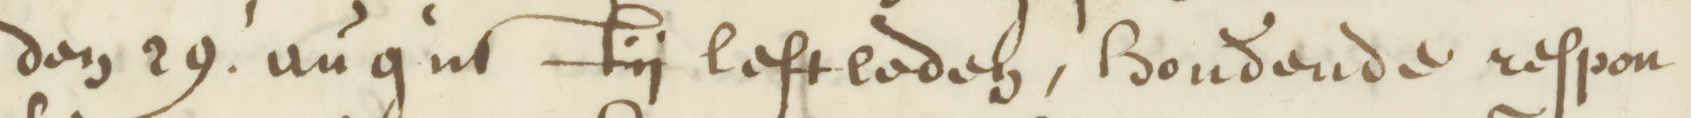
den 29. augustij lestleden, houdende respon„
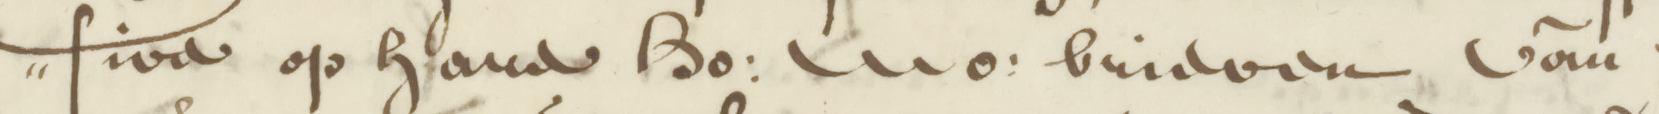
,,sive op hare Ho:Mo: brieven, van
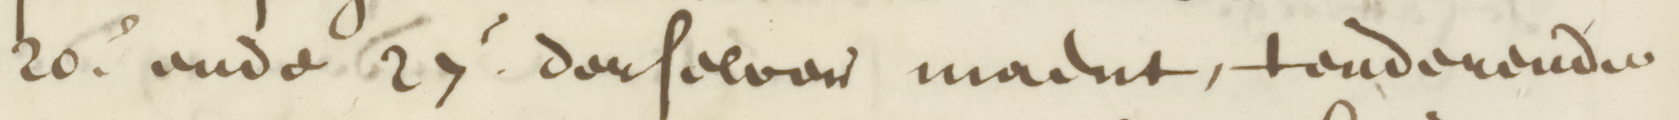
20e. ende 27e. derselver maent, tenderende
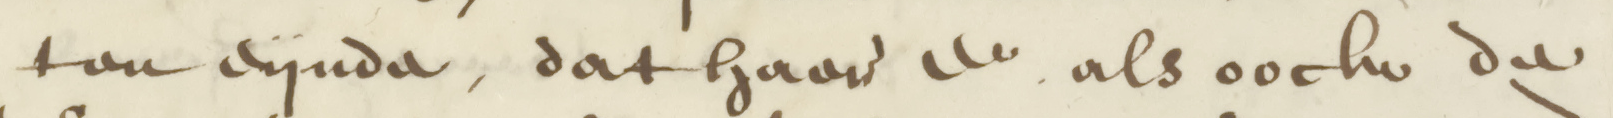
ten eijnde, dat haer E. als oock de
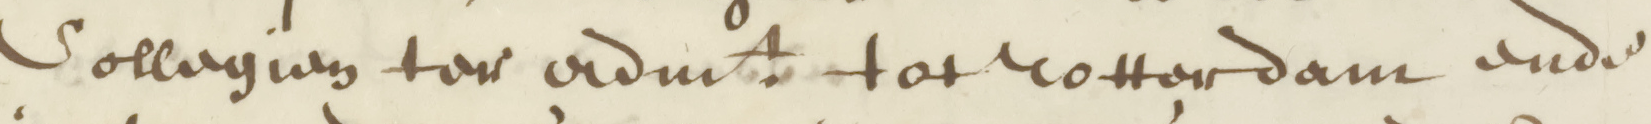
Collegien ter Admt. tot Rotterdam ende
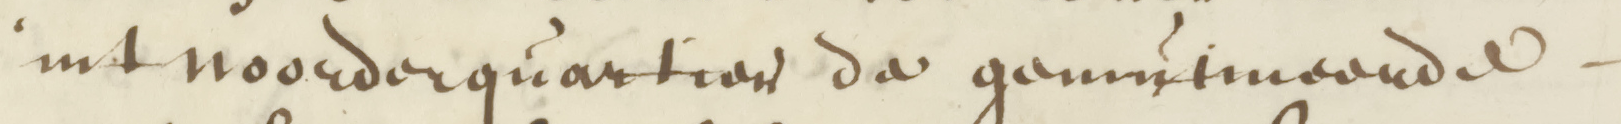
int Noorderquartier de gemutineerde
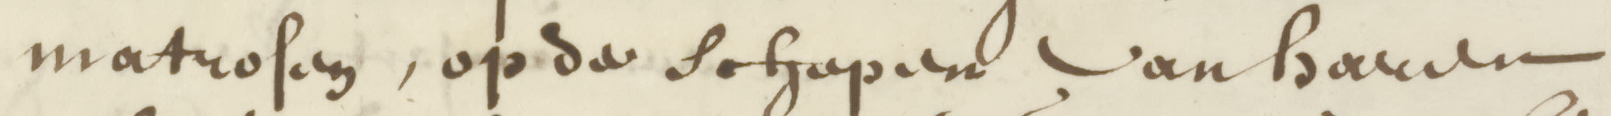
matrosen, op de schepen van haren
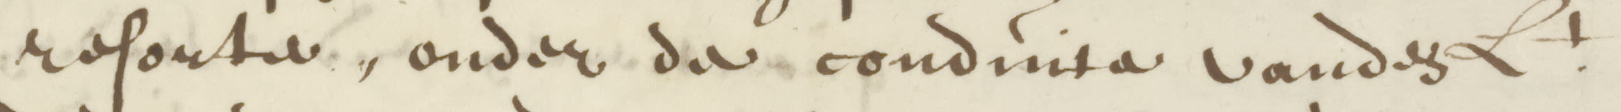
resorte, onder de conduite vanden Lt.
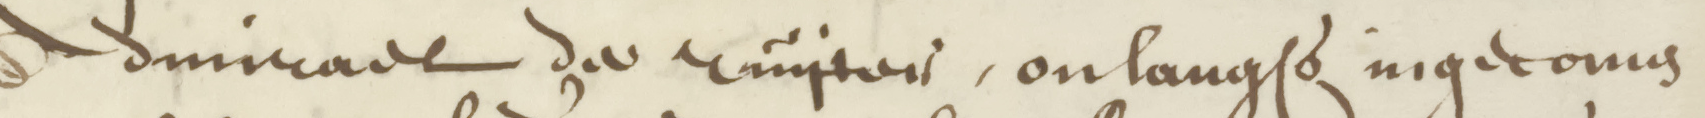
Admirael de Ruijter, onlanghs ingecomen
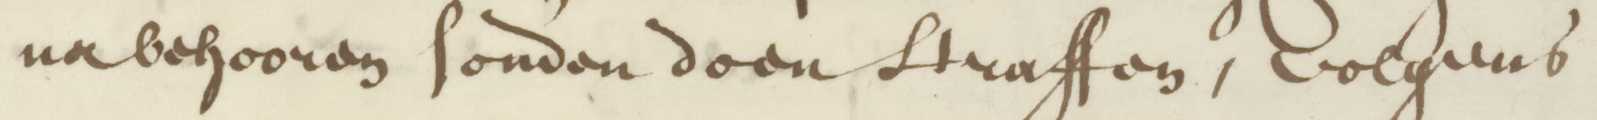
na behooren souden doen straffen, volgens
